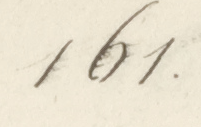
161.
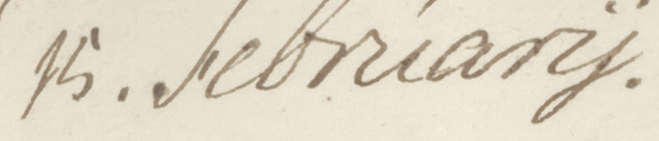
15. Februarij.
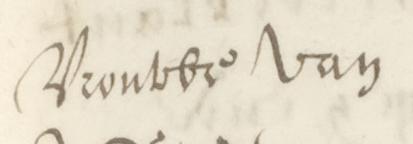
Vrouwe van
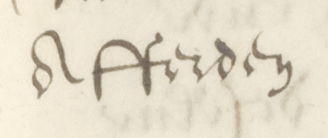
Afferden
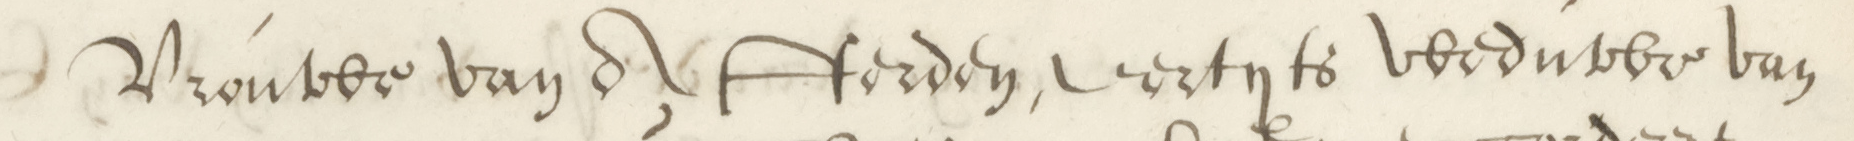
Vrouwe van Afferden, eertyts weduwe van
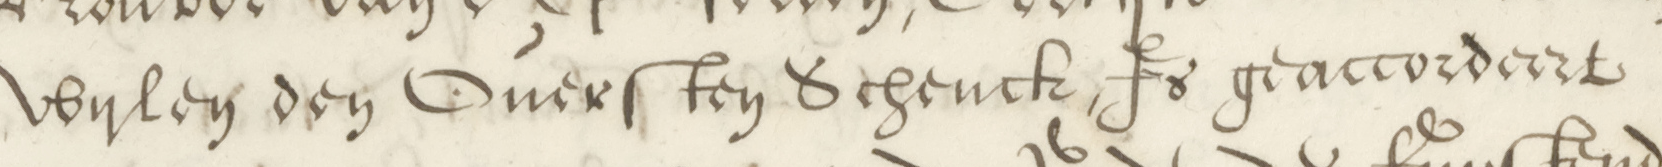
wylen den Ouersten Schenck, Is geaccordeert
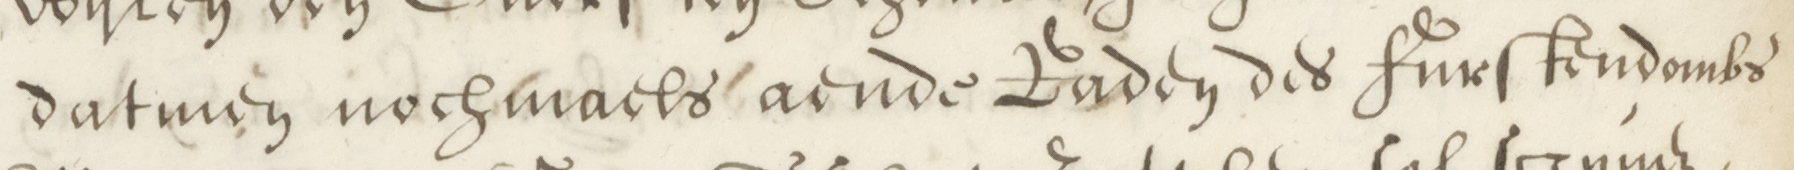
datmen nochmaels aende Raden des furstendombs
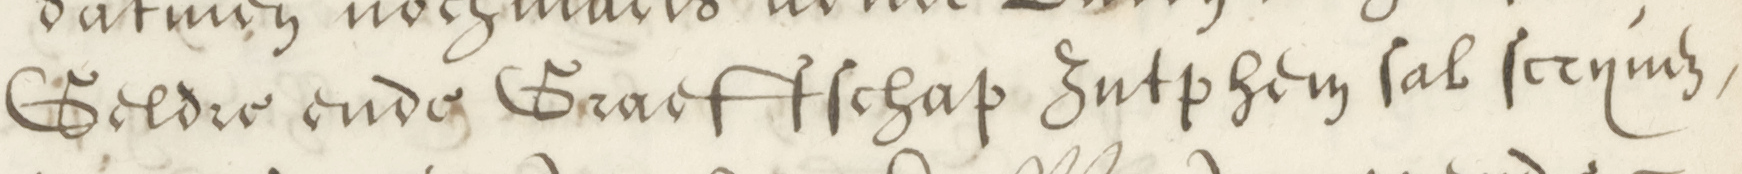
Geldre ende Graeffschap Zutphen sal scryuen,
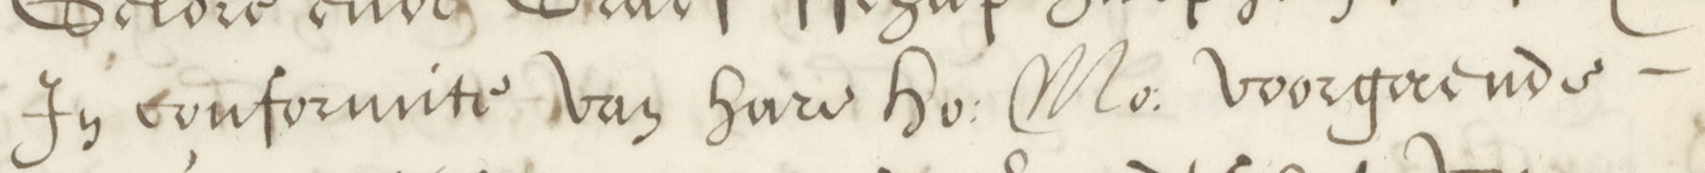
In conformité van hare ho:Mo: voorgaende -
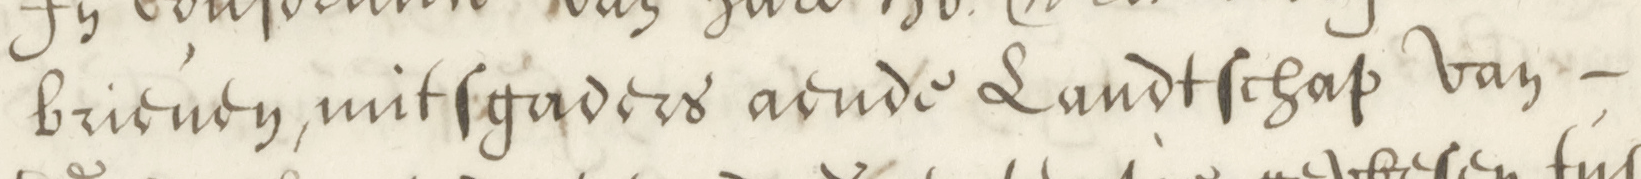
brieuen, mitsgaders aende Landtschap van -
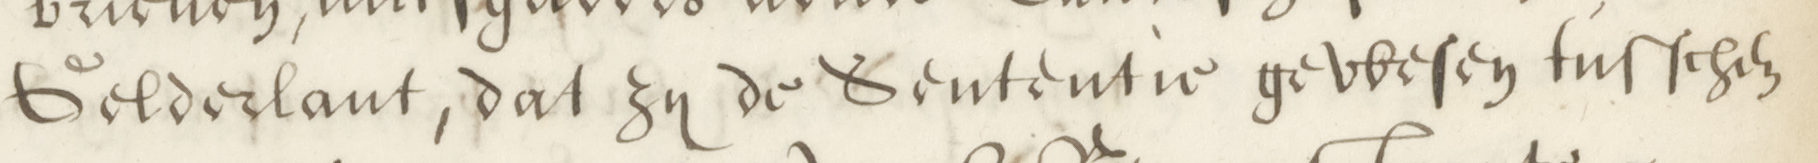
Gelderlant, dat zy de Sententie gewesen tusschen
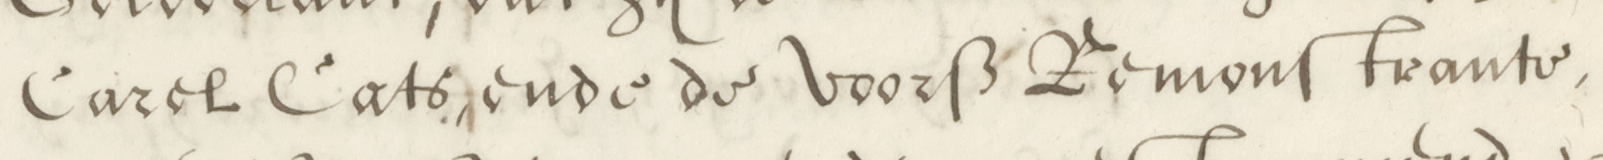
Carel Cats, ende de voors Remonstrante, -
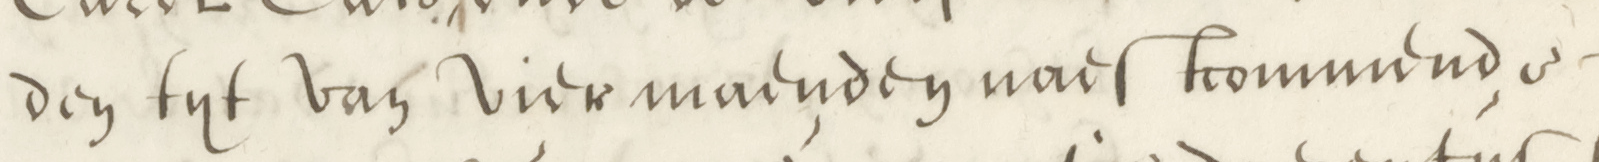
den tyt van vier maenden naestcommende -
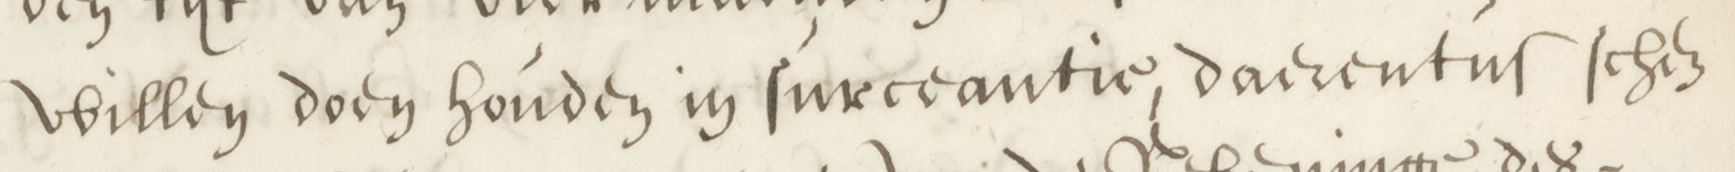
willen doen houden in surceantie, daerentusschen
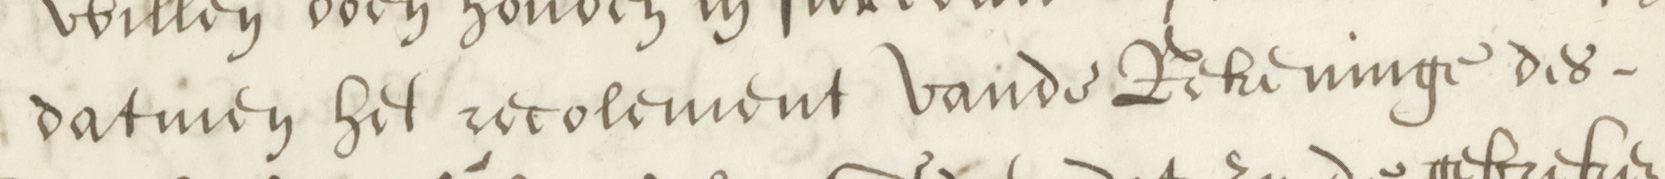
datmen het recolement vande Rekeninge des -
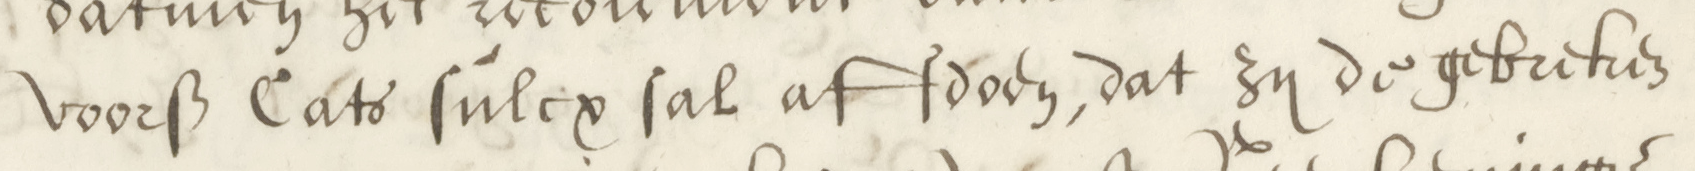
voors Cats sulcx sal affdoen, dat zy de gebreken
